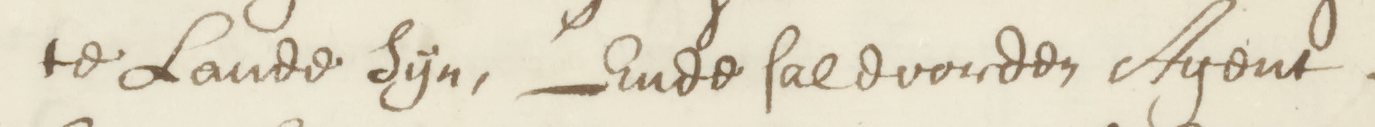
te Lande sijn. Ende sal doorden Agent
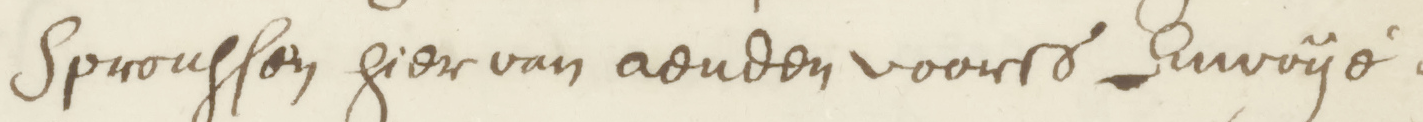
Spronssen hier van aenden voors Envoijé
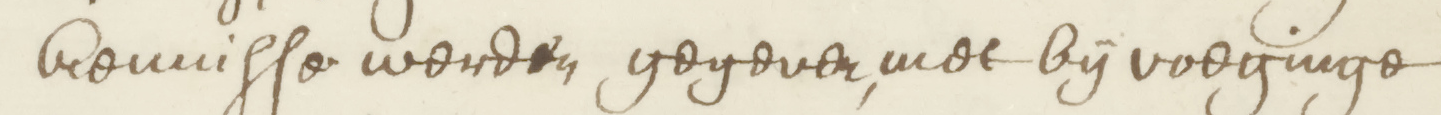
kennisse werden gegeven met bij voeginge
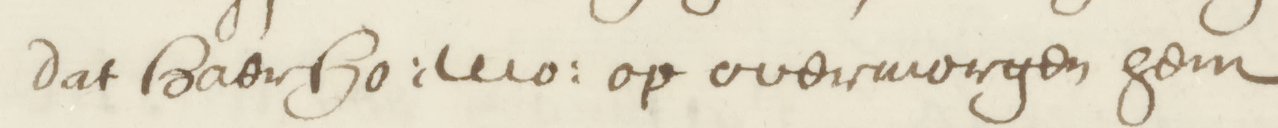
dat haer ho:mo: op overmorgen hem
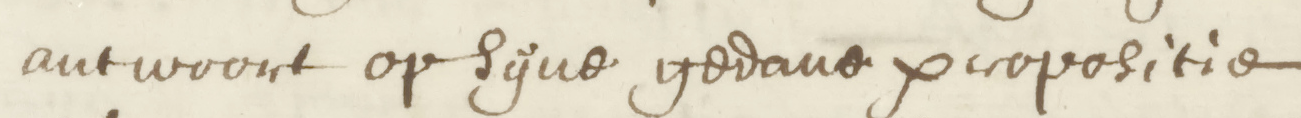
antwoort op sijne gedane propositie
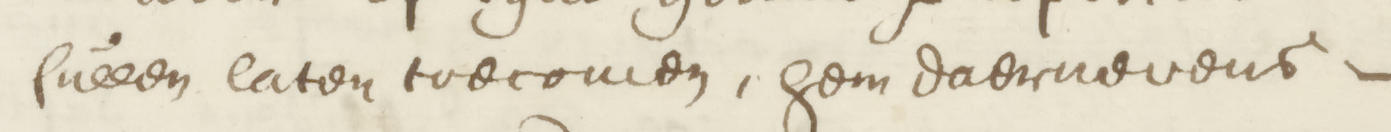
sullen laten toecomen, hem daernevens
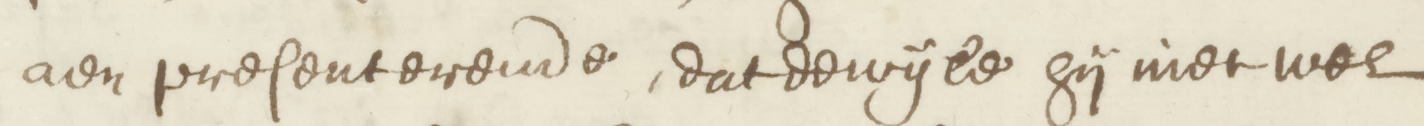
aen presenterende, dat dewijle hij niet wel
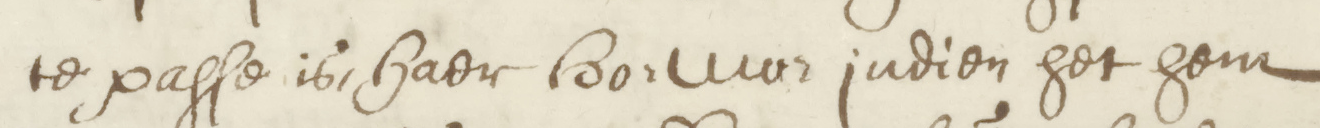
te passe is, haer ho:mo: indien het hem
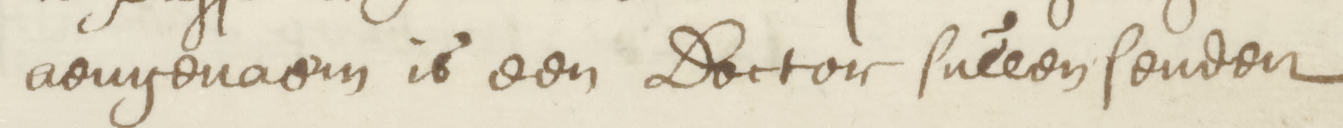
aengenaem is een Doctor sullen senden
